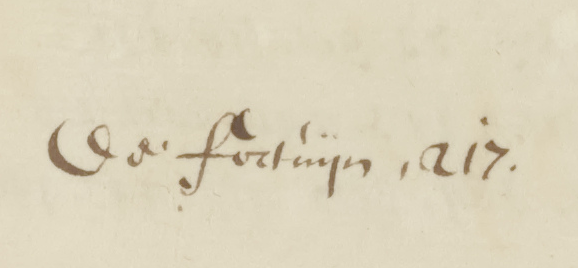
De Fortuijn, 217.
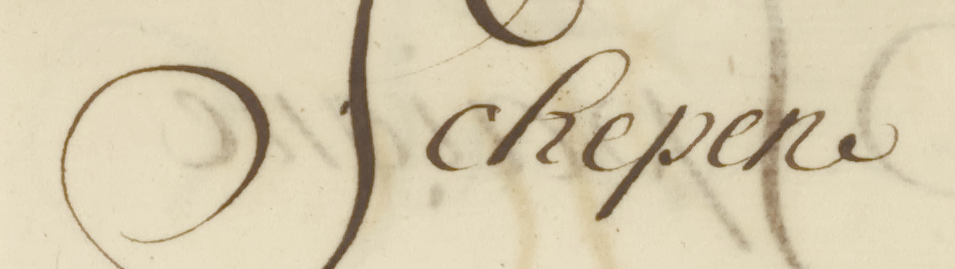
Schepen
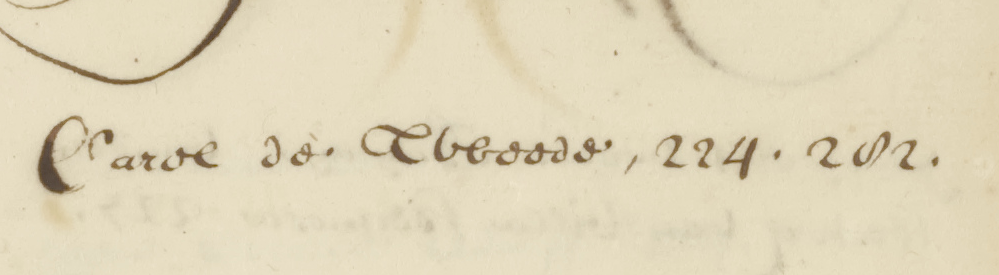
Carel de Tweede, 224, 282.
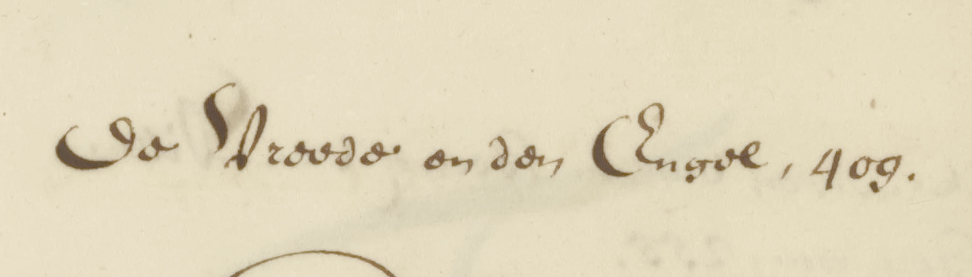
De Vreede om den Engel, 409.
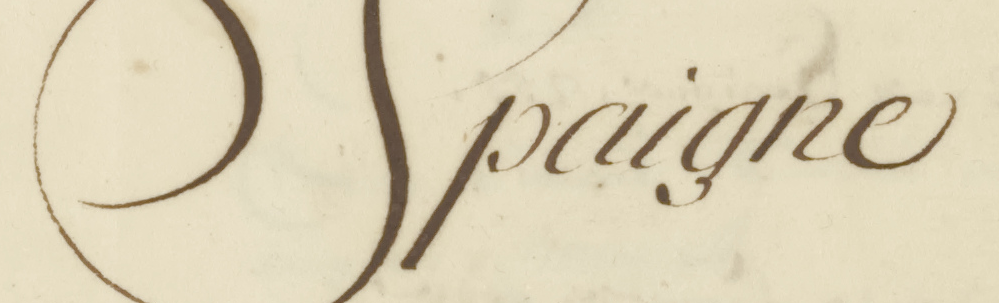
Spaigne
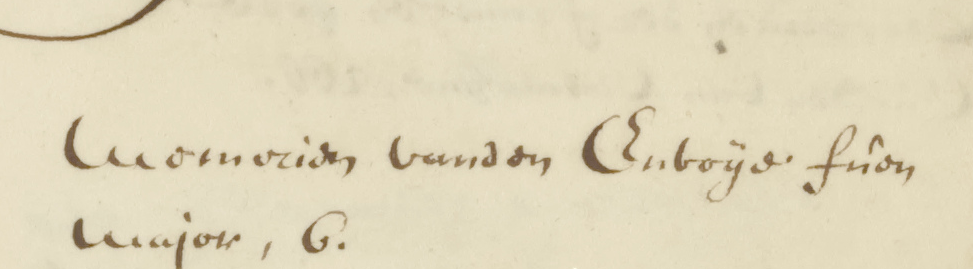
memorien vanden Envoijé fuen
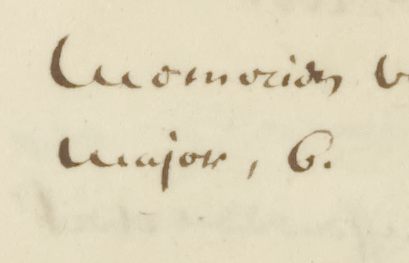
major, 6.
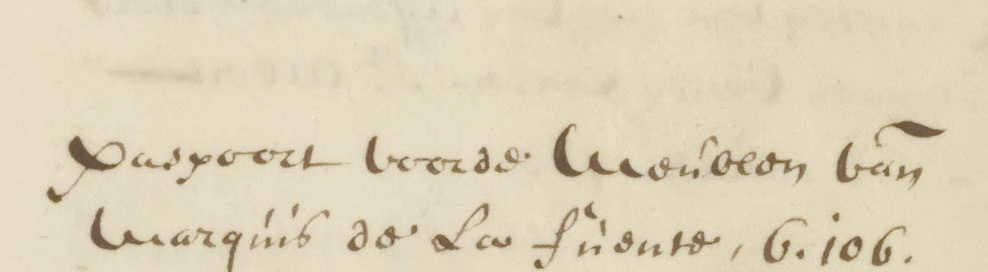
paspoort voorde Meublen van
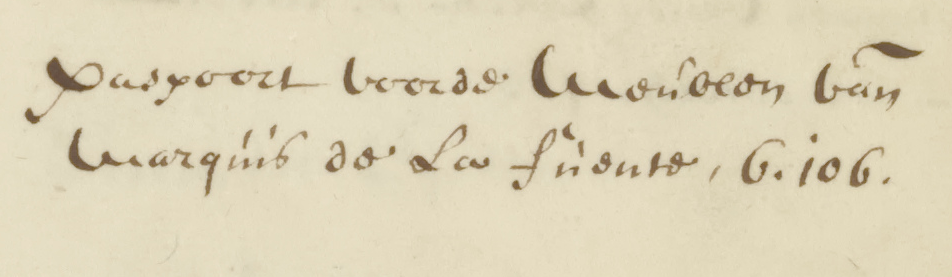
Marquis de La Fuente, 6. 106.
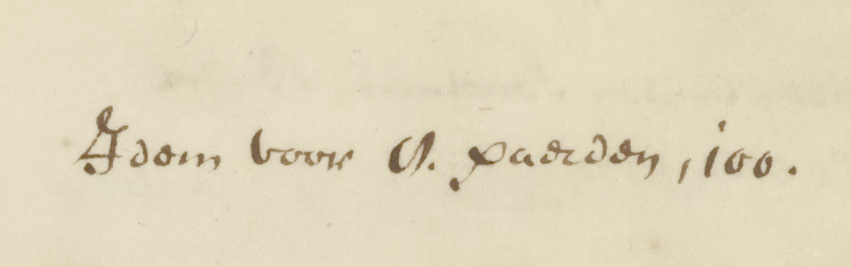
Idem voor 8. paerden, 100.
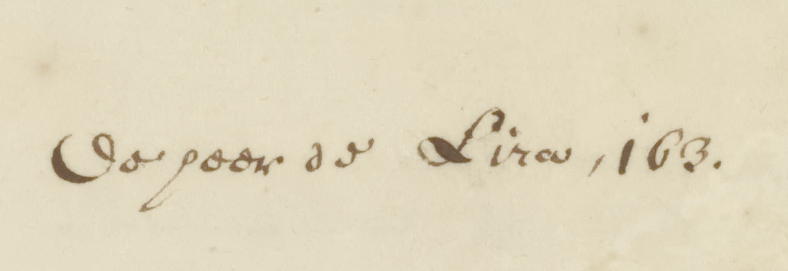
De heer de Lira, 163.
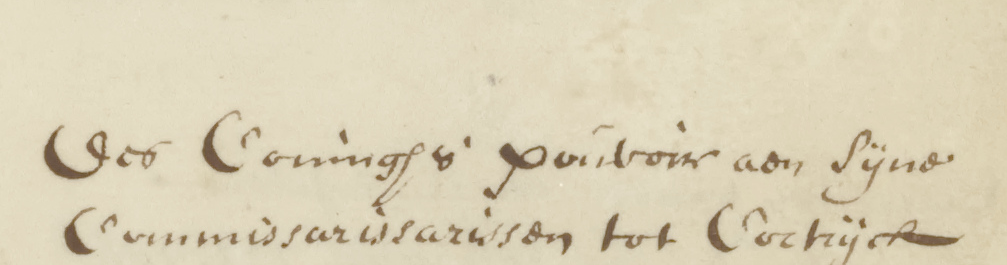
Des Coninghs pouvoir aen sijne
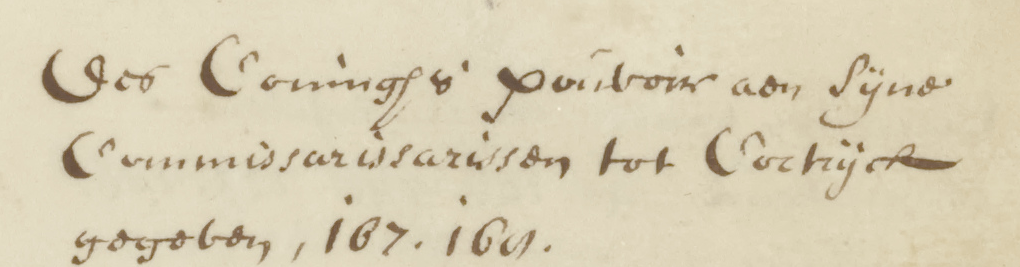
commissarissarssen tot Cortrijck
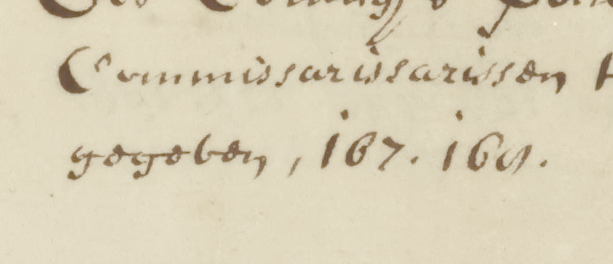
gegeven, 167, 168.
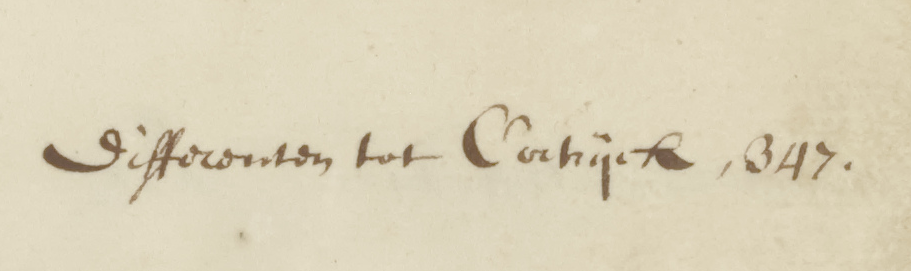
Differenten tot Cortrijck, 347.
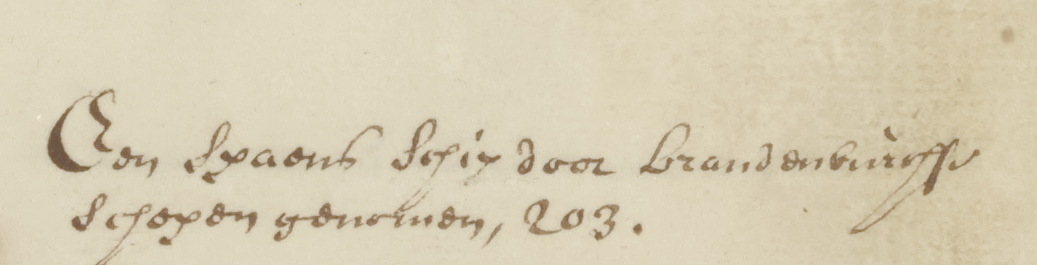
Een Spaens schip door Brandenburchse
